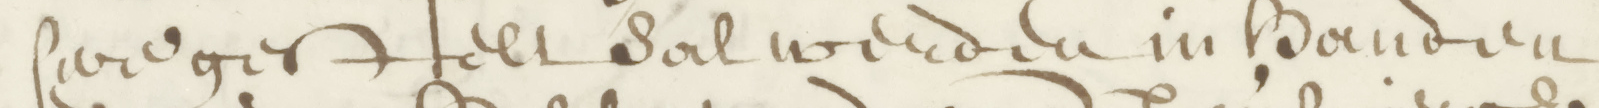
sive gestelt sal werden in handen
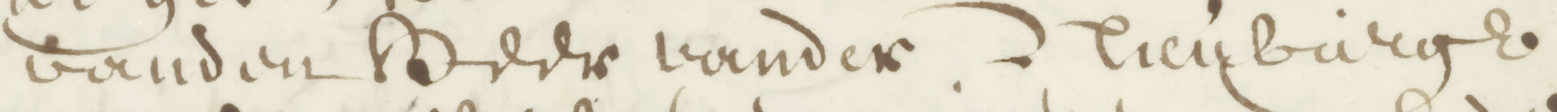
vanden Heer vander Neuburgh
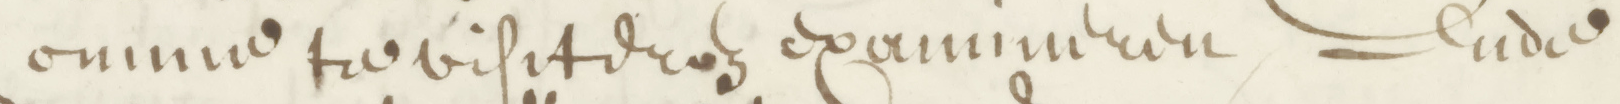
omme te visiteren examineren ende
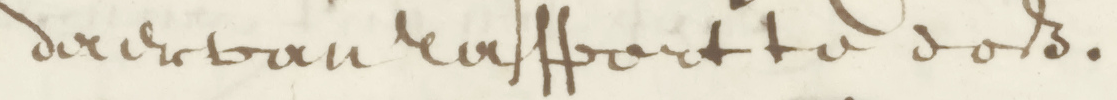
daervan rasport te doen.
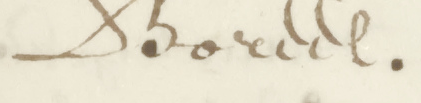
Boreel.
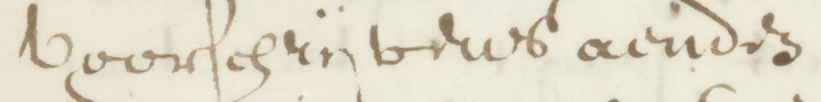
voorschrijvens aenden
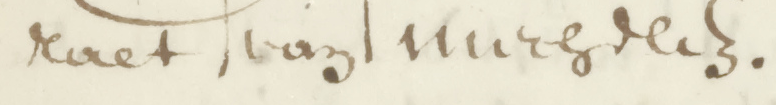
raet van mechelen,
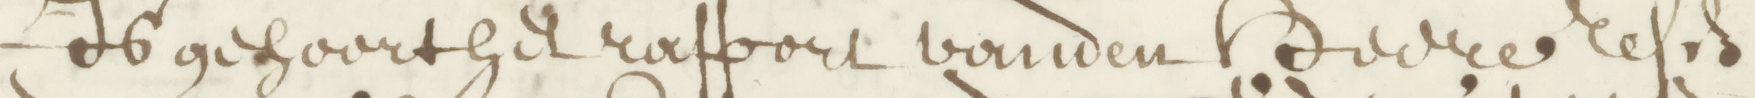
Is gehoort het rapport vanden Heere Resen
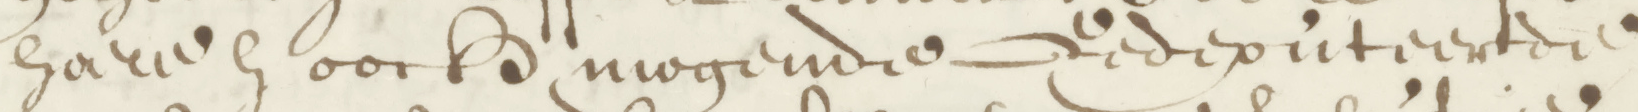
hare hooch mogende Gedeputeertde
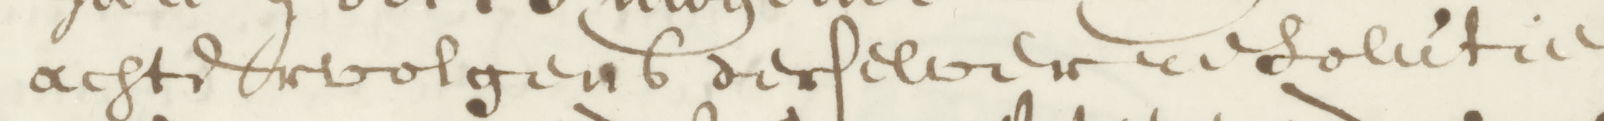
achtdervolgens derselver resolutie
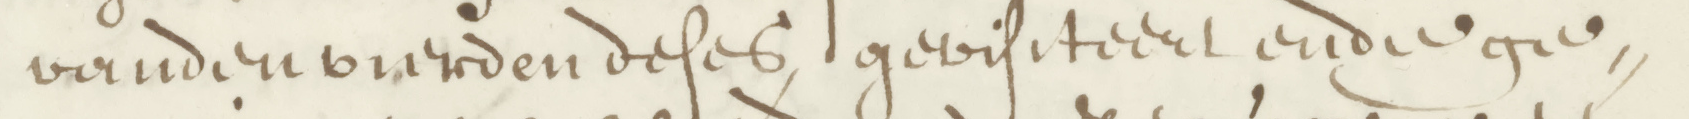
vanden vierden deses, gevisiteert ende ge„
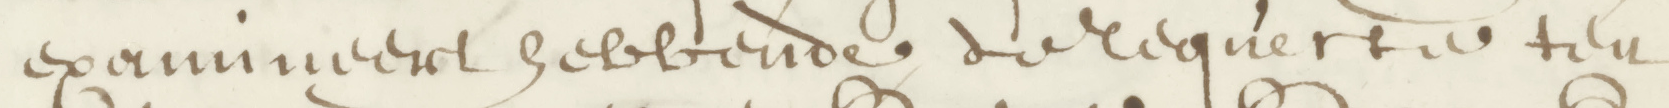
examineert hebbende de requeste ten
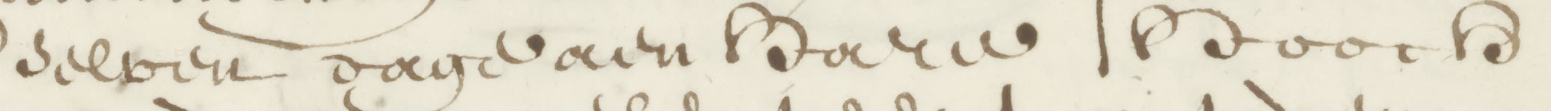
selven dage aen hare Hooch
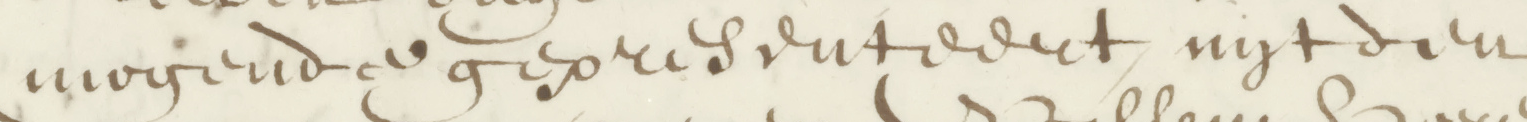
mogende gepresenteert, uijt den
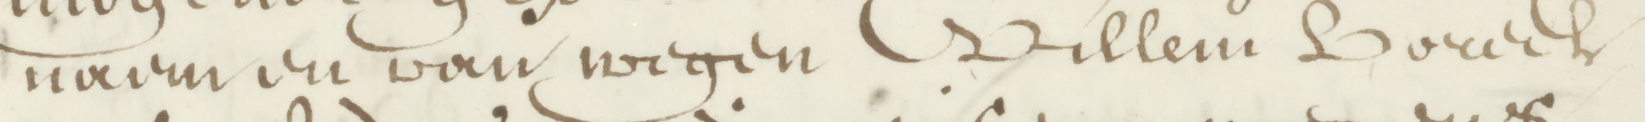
naem en van wegen Willam Boreel
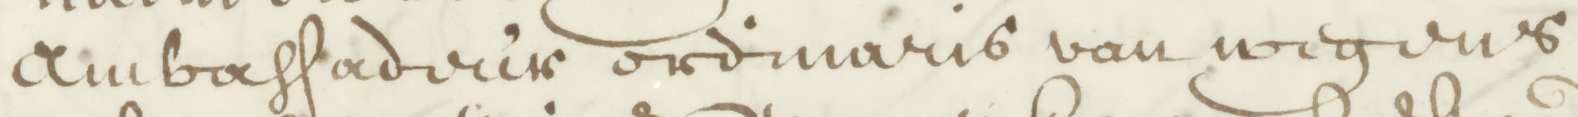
Ambassadeur ordinaris van wegens
